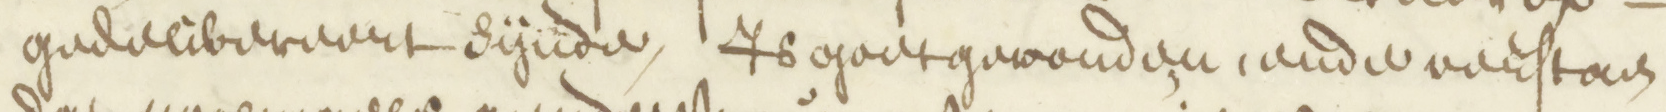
gedelibereert sijnde, Is goetgevonden, ende verstaen,
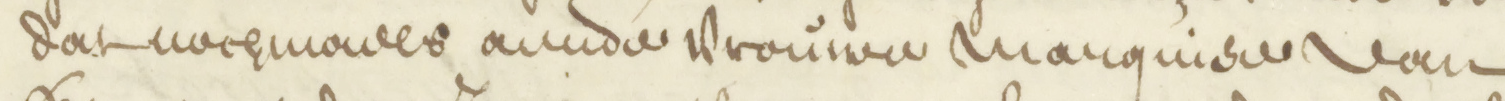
dat nochmaels aende Vrouwe Marquise van
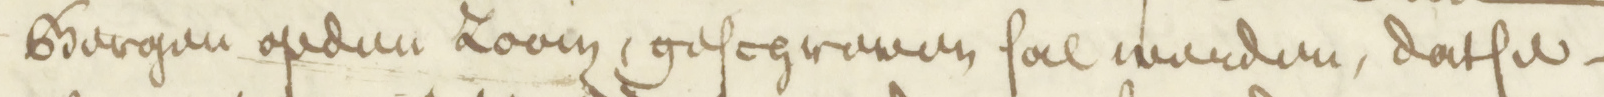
Bergen opden Zoom, geschreven sal werden, datse
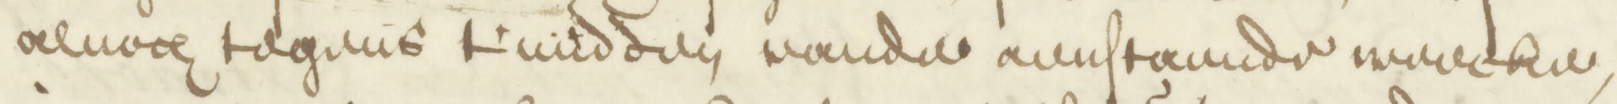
alnoch tegens t' midden vande aenstaende weecke,
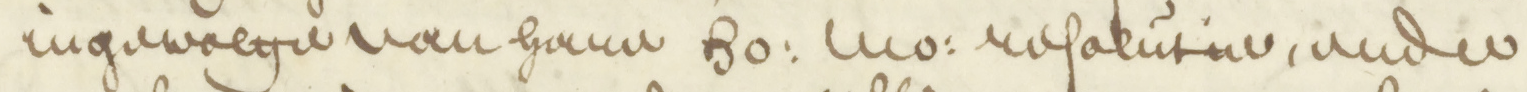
ingevolge van hare ho:Mo: resolutie, ende
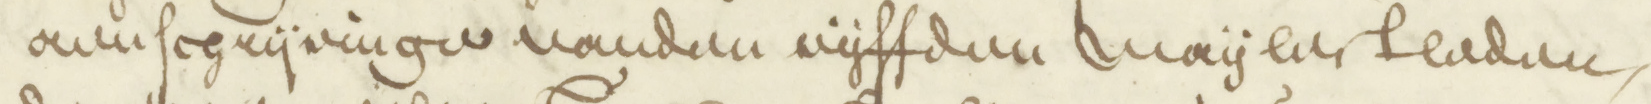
aenschrijvinge vanden vijffden Maij lestleden,
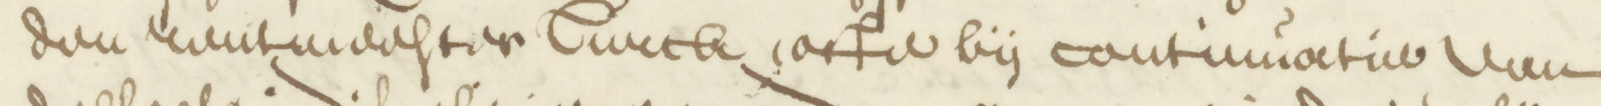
den rentmeester Turck, ofte bij continuatie van
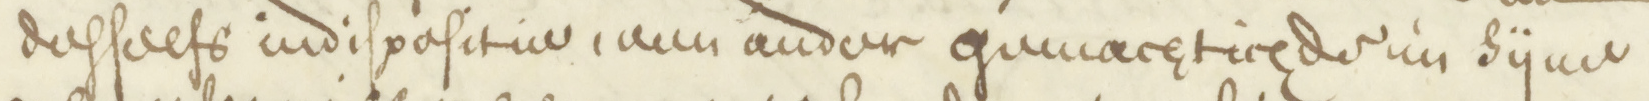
desselfs indispositie, een ander gemachtichde in sijne
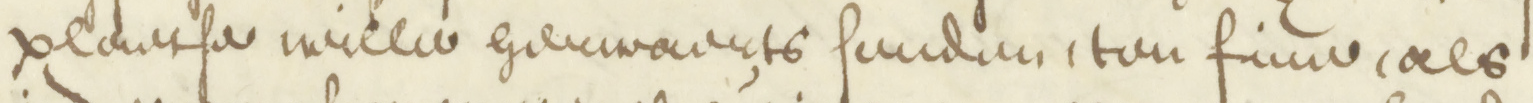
plaetse wille herwaerts senden, ten fine, als
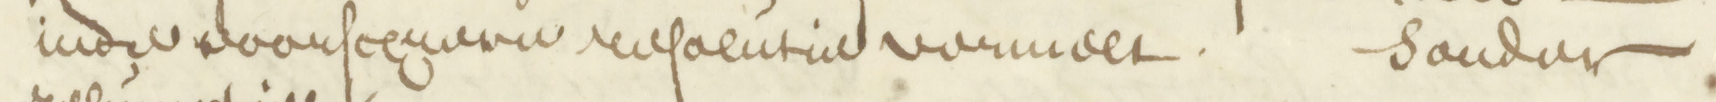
inde voorschreve resolutie vermelt. Sonder
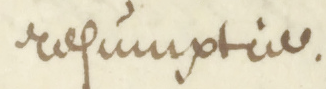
resumptie.
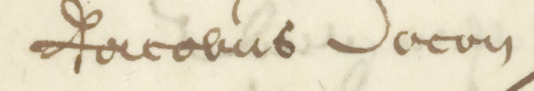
Jacobus Docon
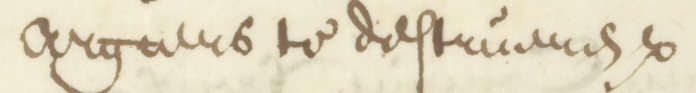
Argiers te destrueren @
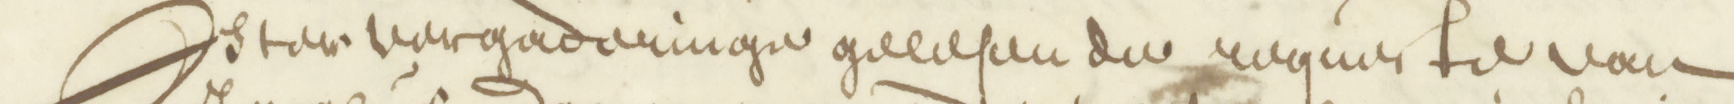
Is ter vergaderinge gelesen de requeste van
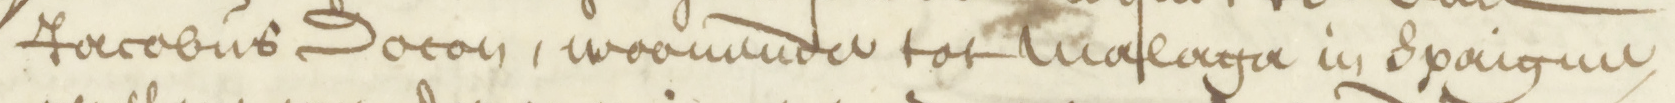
Jacobus Docon, woonende tot Malaga in Spaigne,
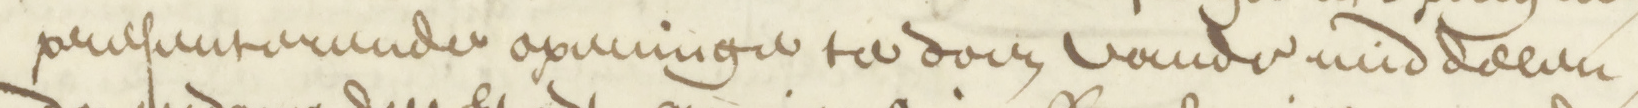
presenterende openinge te doen vande middelen,
